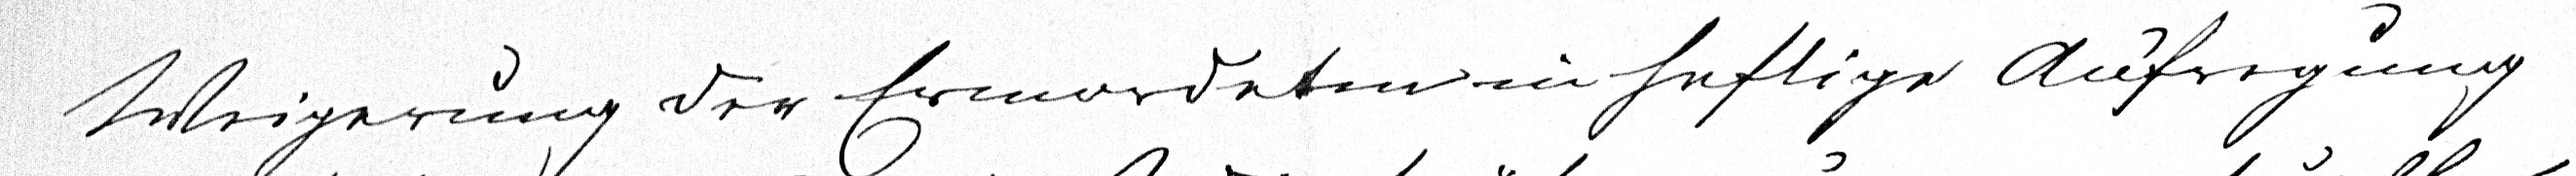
Weigerung der Ermordeten in heflige Aufregung
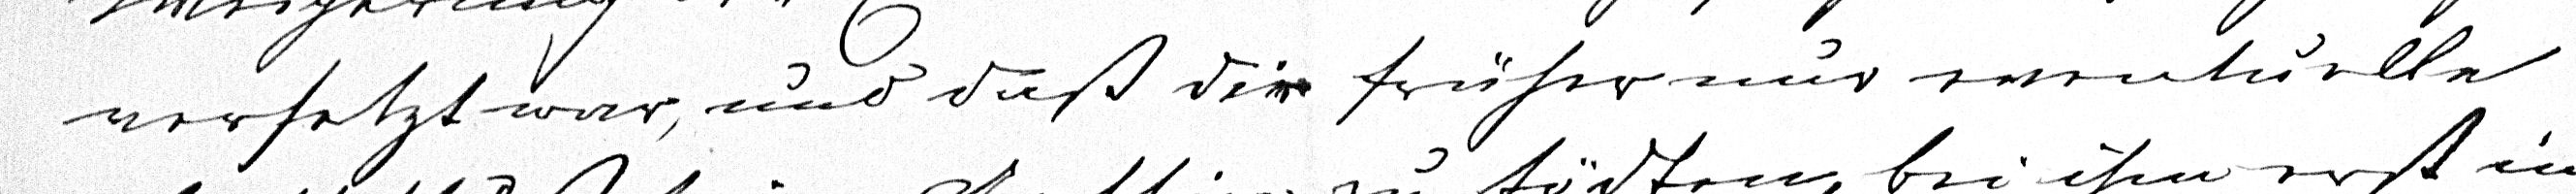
versetzt war, und daß die früher nur eventuelle
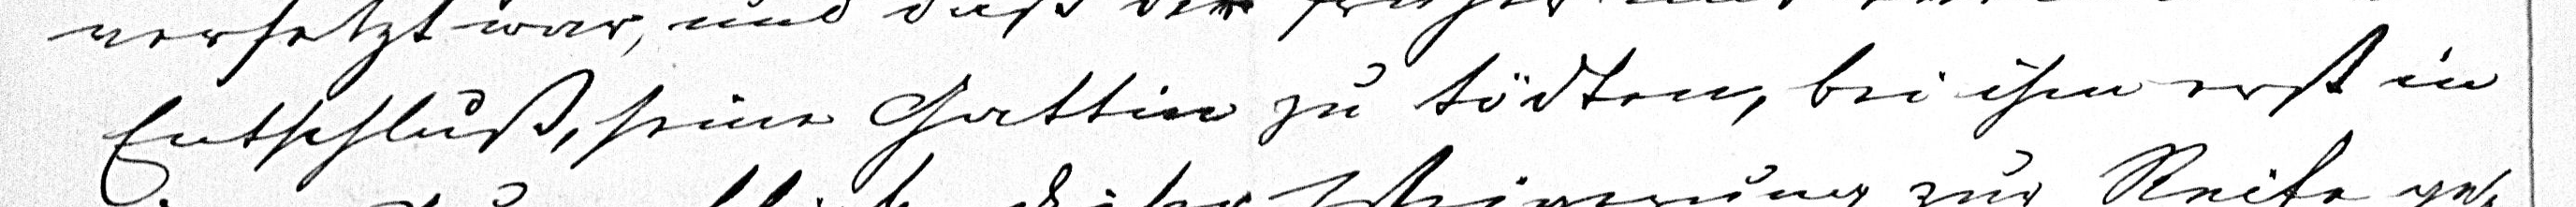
Entschluß, seine Gattin zu tödten, bei ihm erst in
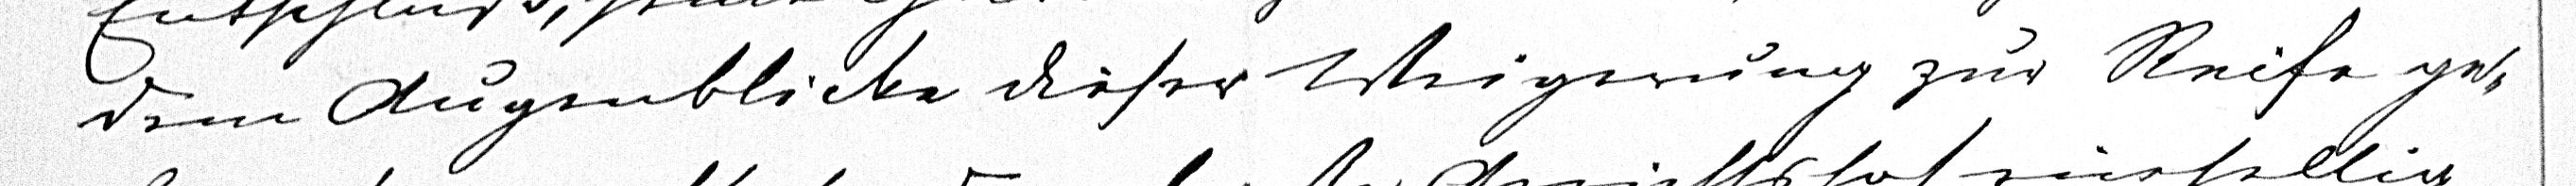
dem Augenblicke dieser Weigerung zur Reife ge¬
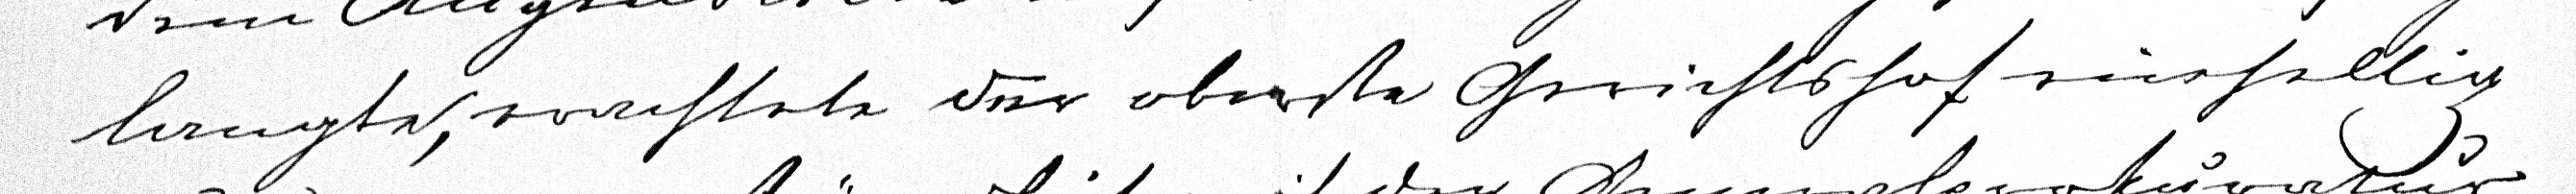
langte, erachtete der oberste Gerichtshof einhellig
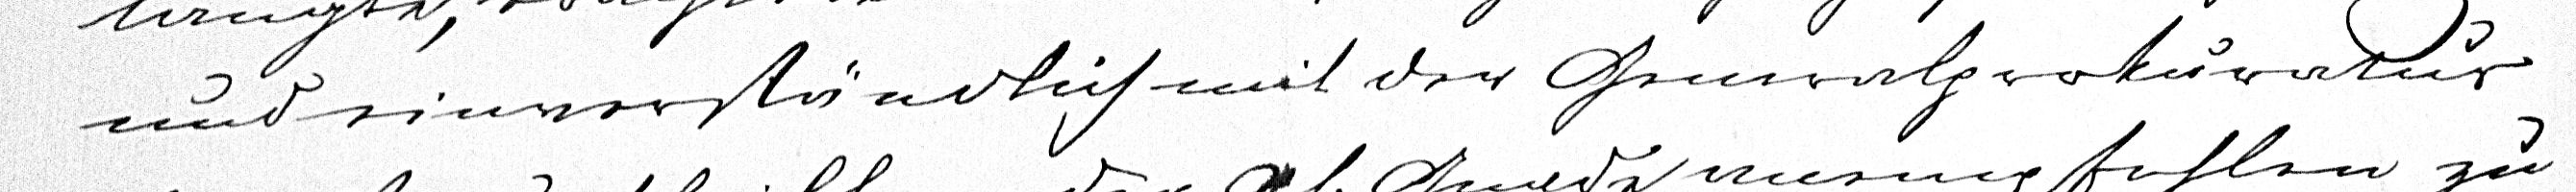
und einverständlich mit der Generalprokuratur
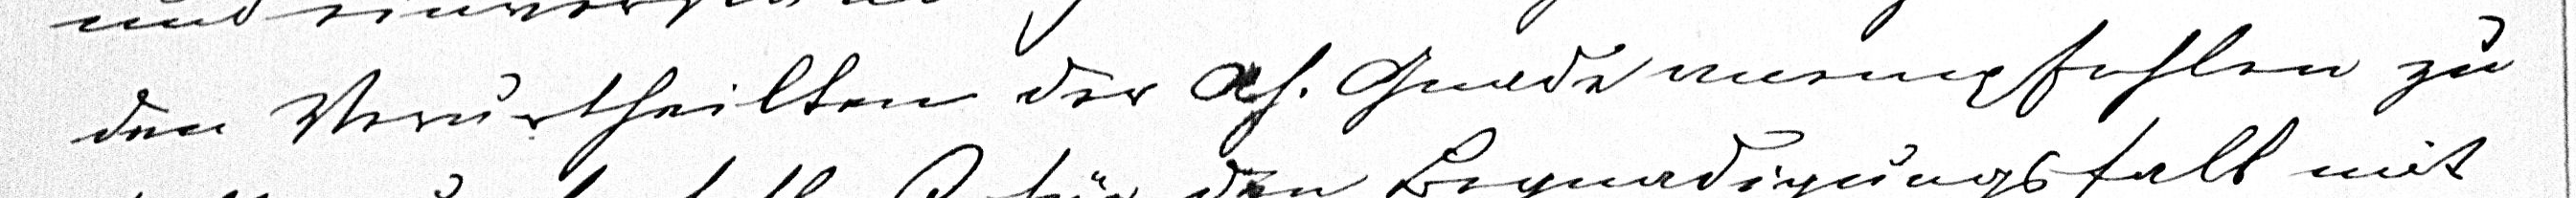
den Verurtheilten der Ah. Gnade anempfohlen zu
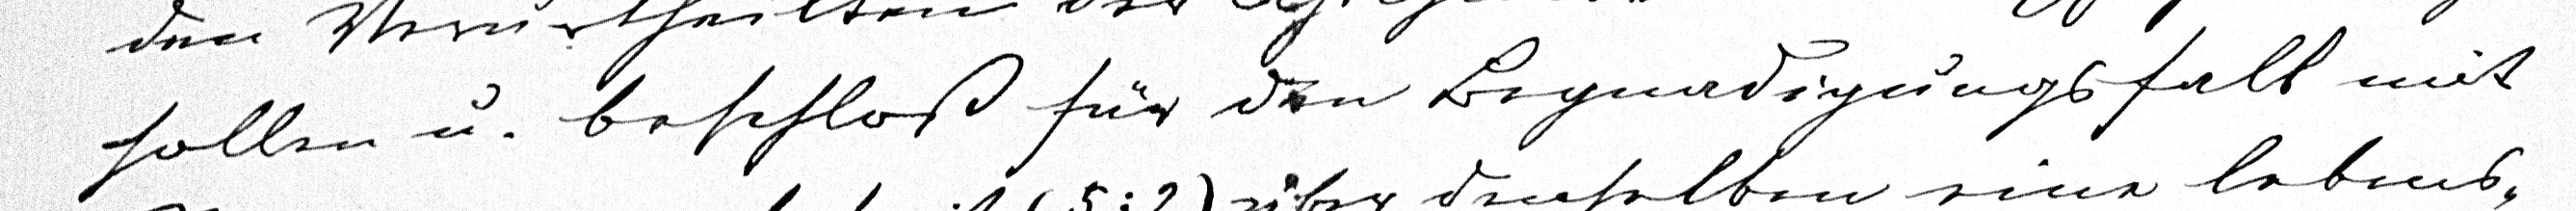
sollen u. beschloß für den Begnadigungsfall mit
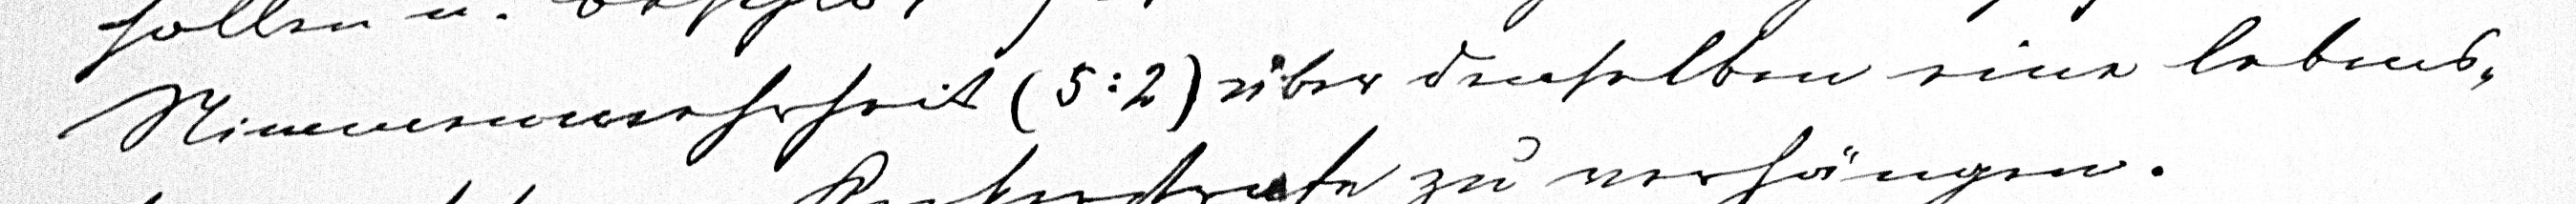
Stimmenmehrheit (5:2) über denselben eine lebens¬
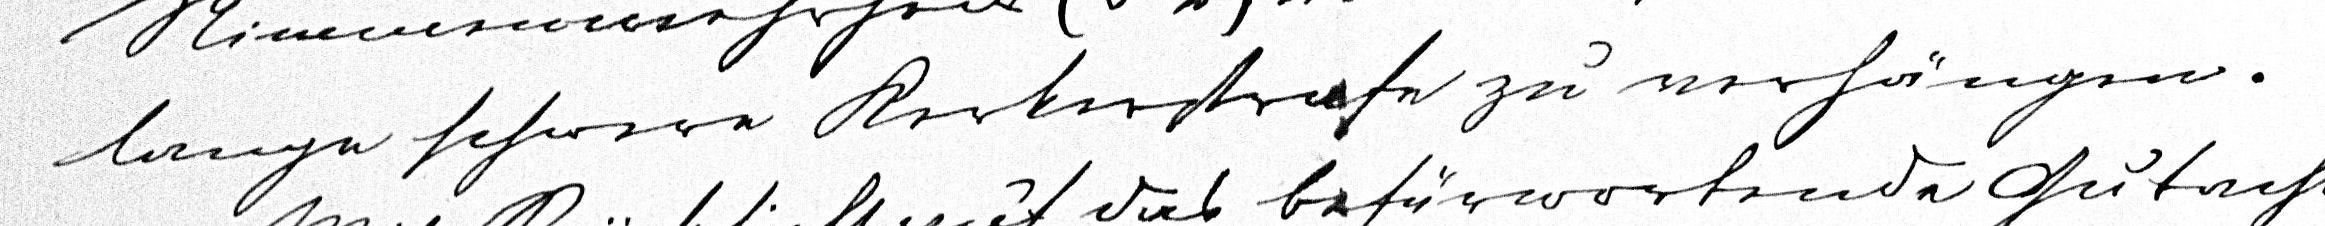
lange schwere Kerkerstrafe zu verhängen.
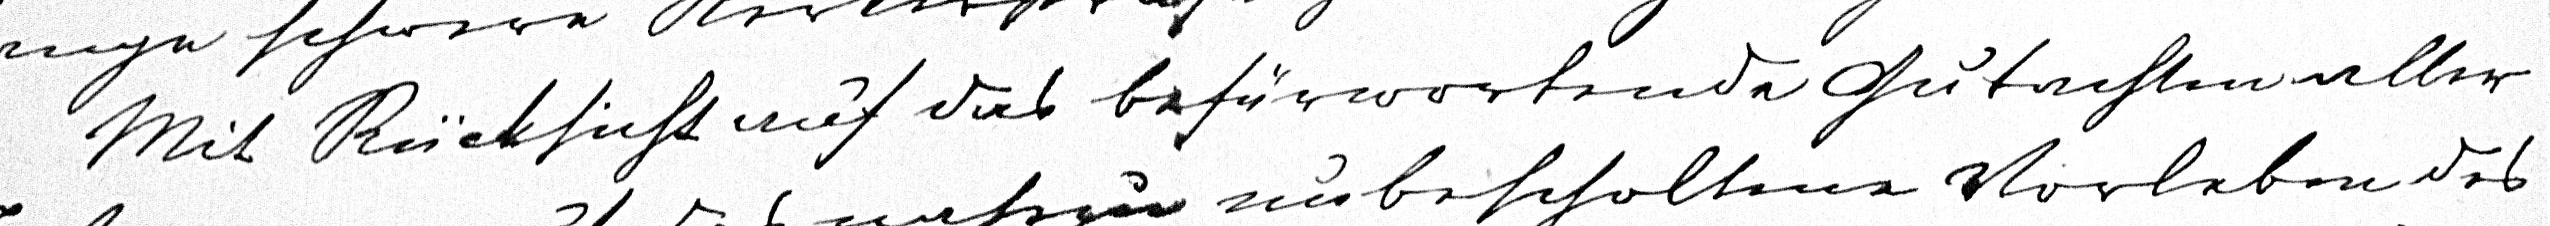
Mit Rücksicht auf das befürwortende Gutachten aller
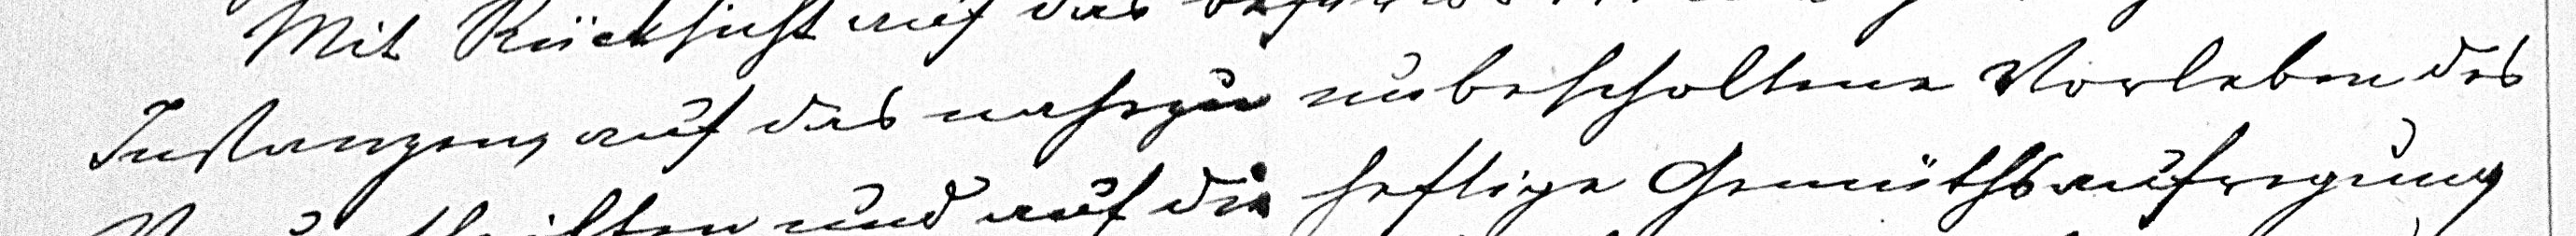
Instanzen auf das nahezu unbescholtene Vorleben des
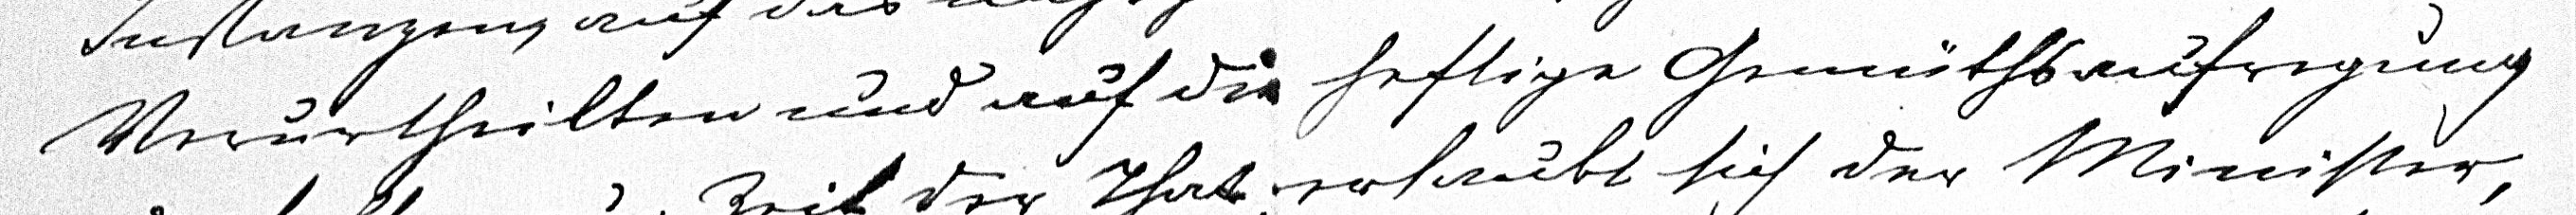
Verurtheilten und auf die heftige Gemüthsaufregung
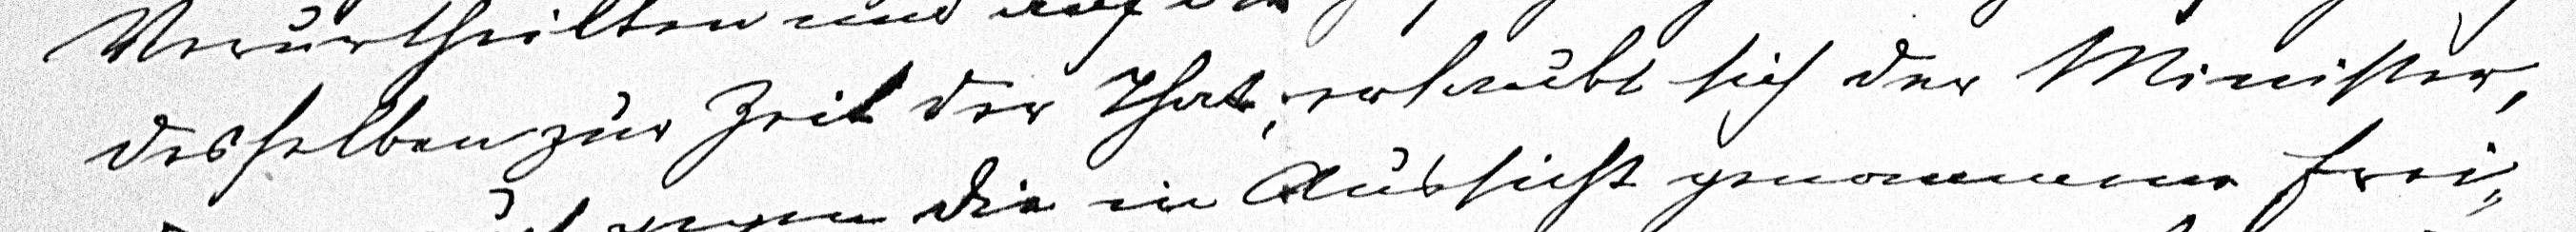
desselben zur Zeit der That, erlaubt sich der Minister,
